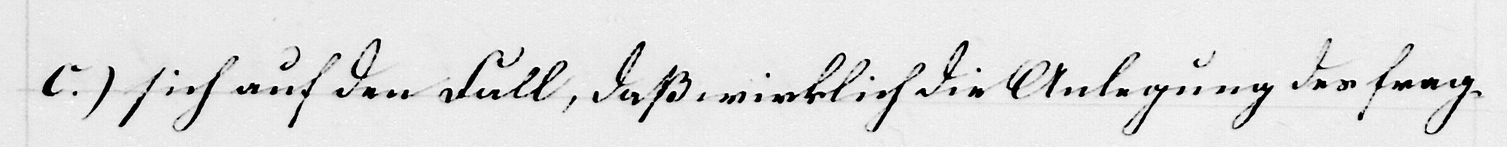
c.) sich auf den Fall, daß wirklich die Anlegung des frag¬
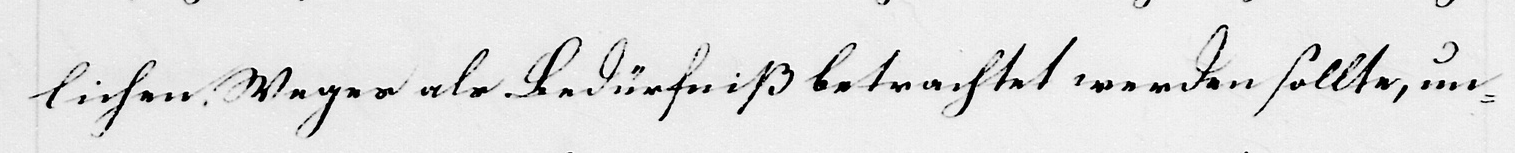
lichen Weges als Bedürfniß betrachtet werden sollte, un¬
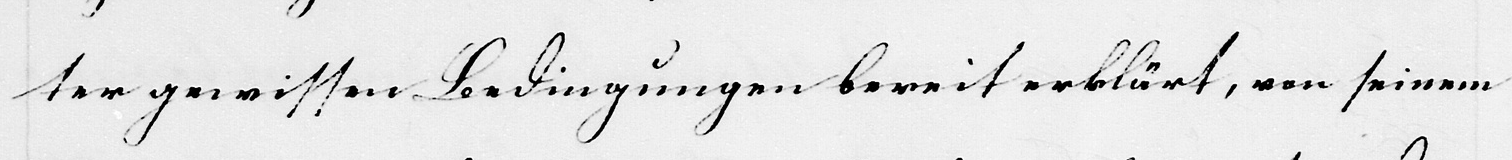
ter gewissen Bedingungen bereit erklärt, von seinem
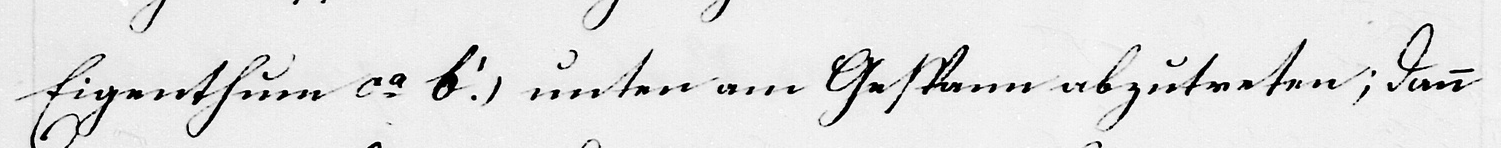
Eigenthum ca [?] [Fuss] unten am Gespann abzutreten; dann
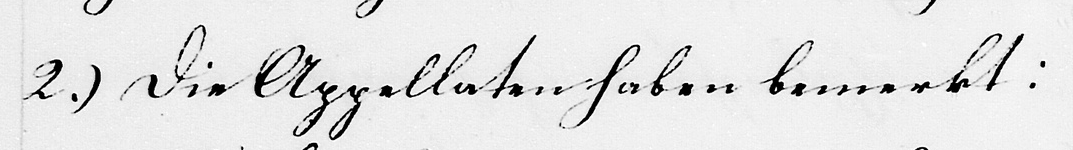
2.) Die Appellaten haben bemerkt:
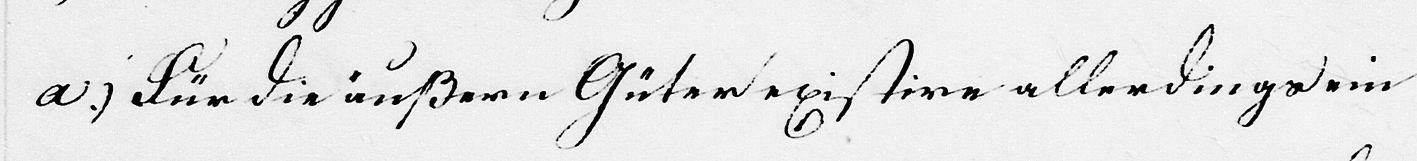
a.) Für die äußern Güter existire allerdings ein
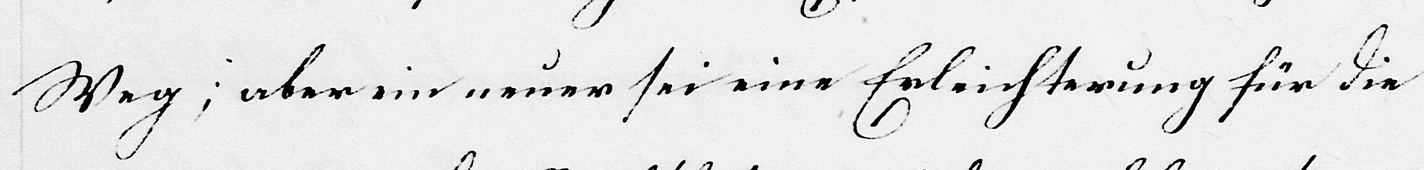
Weg; aber ein neuer sei eine Erleichterung für die
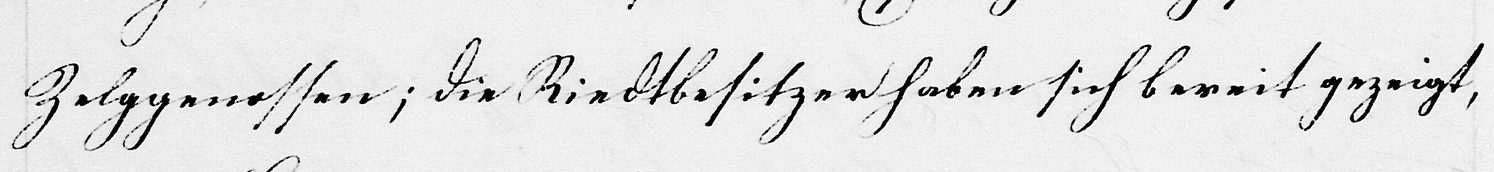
Zelggenossen; die Riedtbesitzer haben sich bereit gezeigt,
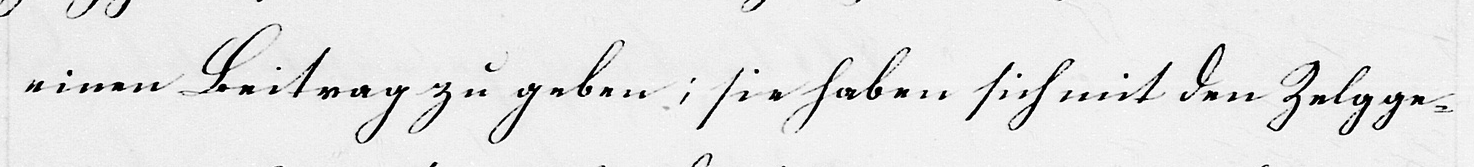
einen Beitrag zu geben; sie haben sich mit den Zelgge¬
